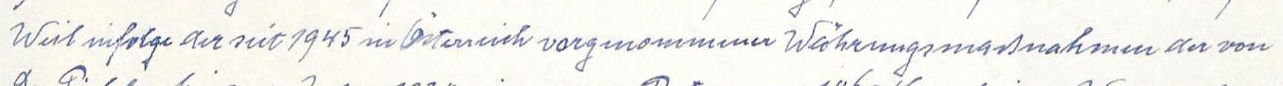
Weil infolge der seit 1945 in Österreich vorgenommen Währungsngmaßnahmen der von
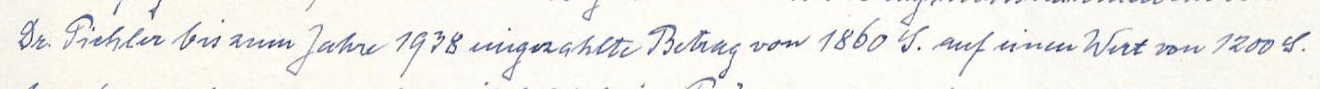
Dr. Pichler bis zum Jahre 1938 eingezahlte Beitrag von 1860 S. auf einen Wer von 1200 S
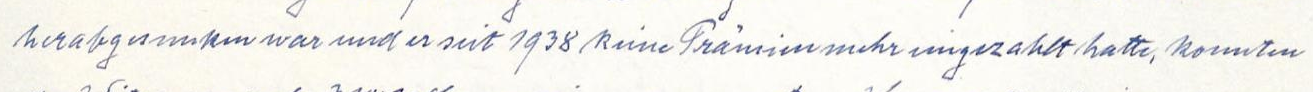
herabgesunken war und er seit 1938 keine Prämien mehr eingezahlt hatte, konnten
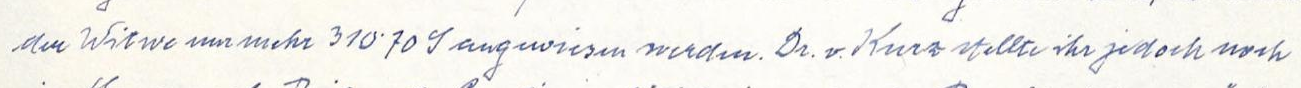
der Witwe einer mehr 310.70 ausgewiesen werden. Dr. v. Kurz stellte ihr jedoch noch
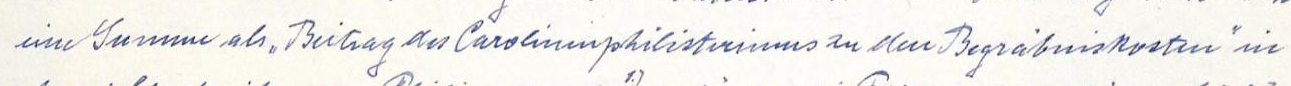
eine Summe als „Beitrag des Carolinenphilisteriums zu den Begräbniskosten“ in
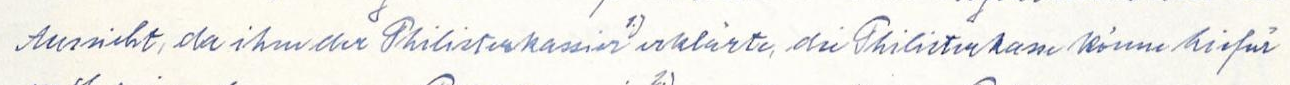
Ausicht, da ihm der Philisterkassier 1) erklärte, die Philisterkase könne hiefür
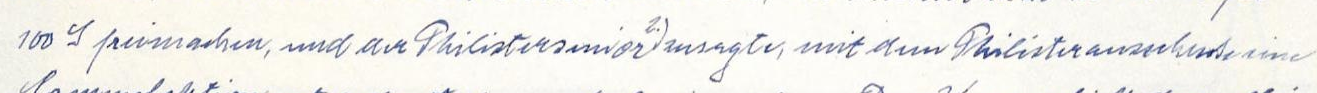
100 S freimachen und der Philistersenior 2) sagte, mit dem Philisterausschuße eine
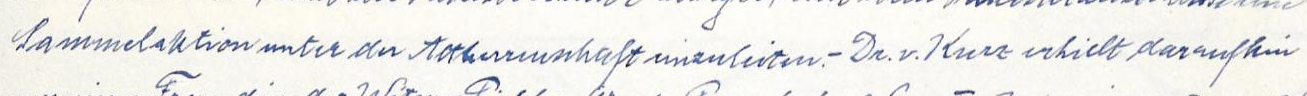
Sammelaktion unter der Altherrenschaft einzuleiten. Dr. v. Kurz erhielt daraufhin
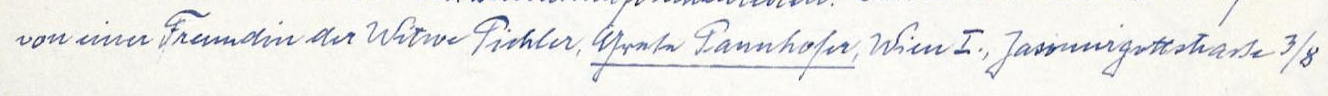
von einer Frueundin der Witwe Pichler, Grete Pannhofer, Wien I, Jasomirgottstraße. 3/8
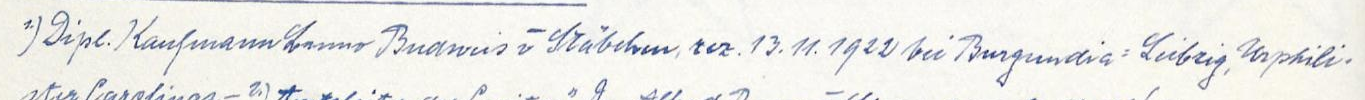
1) Dipl. Kaufmann Benno Budweis v/o Stäbchen, rez. 13. 11. 1922 bei Burgundia- Leibzig, Urphili-
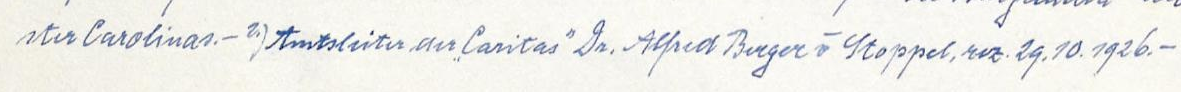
ster Carolinas. - 2) Amtsleiter der Caritas“ Dr. Alfred Burger v/o Soppel, rez. 29. 10. 1926.
